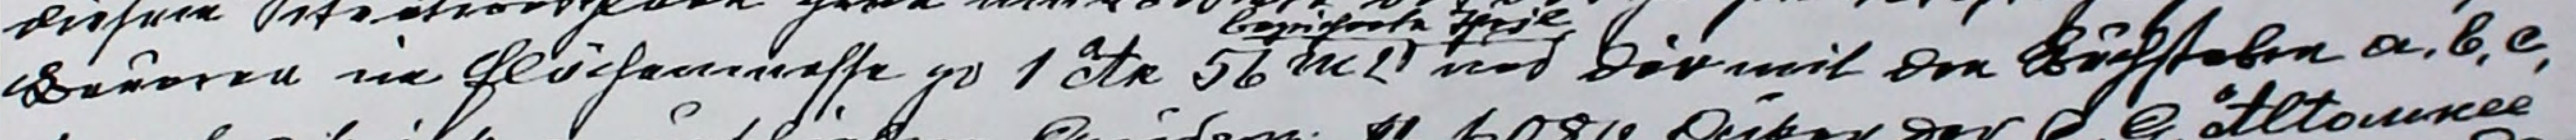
Brunnen in Flächenmesse pr 1 An 56nm 2 und der mit Buchstaben a, b, c, d, e, f, g, h, i, k, a umschriebene Grundparz: No 608/2 Äcker der C.G. Altaussee
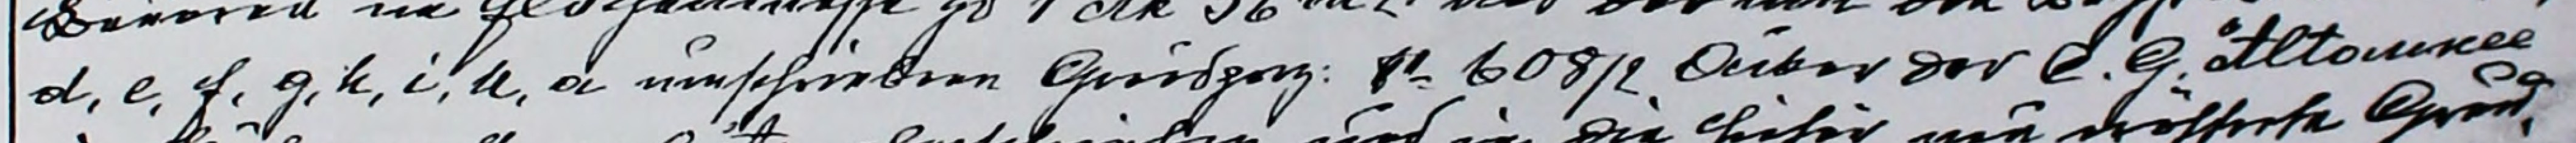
im Flächenmesse pr 8 An abgeschrieben und in die Hiefür neu eröffnete Grund„
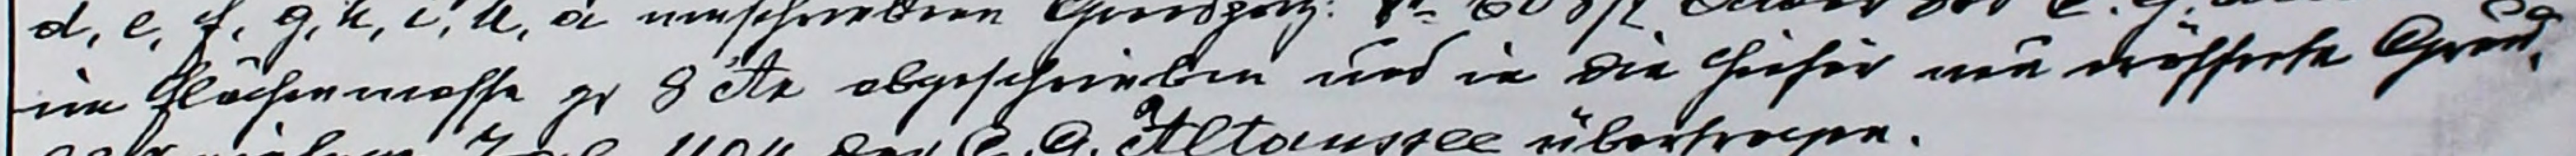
Buchseinlage Zal 404 der C.G. Altaussee übertragen.
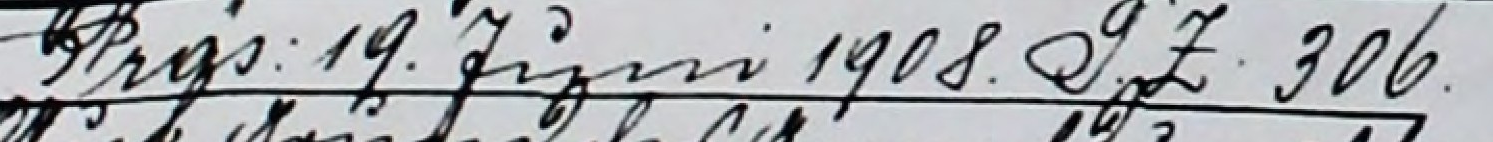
Präs: 19. Juni 1908. T.Z. 306.
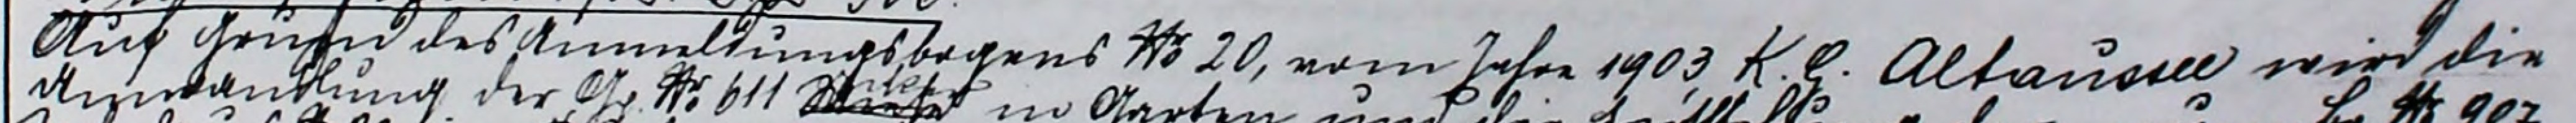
Auf Grund des Anmeldungsbogens No 20, vom Jahre 1903, K.G. Altaussee wird die
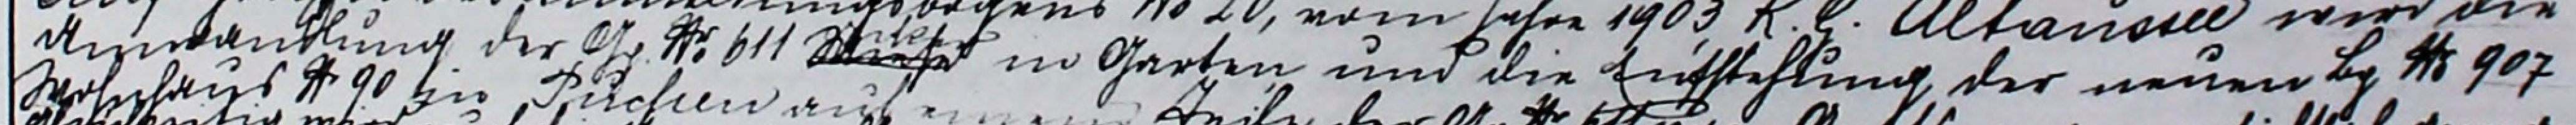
Umwandlung der Gg. No 611 Acker in Garten und die Eichstehung, der neuen Bg No 907
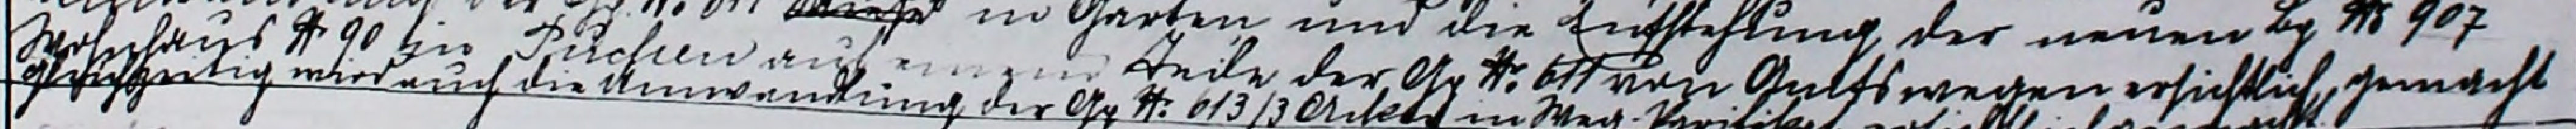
Wohnhaus No 90 in Puchen auf einem Teile der Gg No 611 von Amtswegen ersichtlich, gemacht
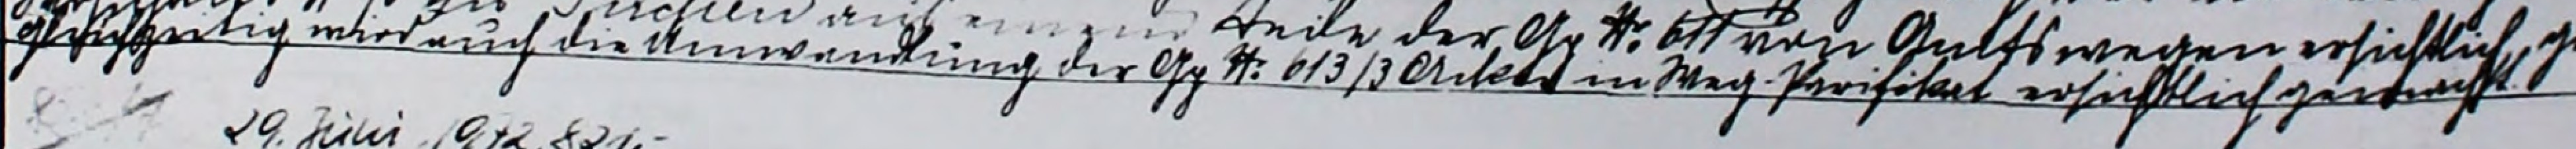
G??chzeitig wird auch die Umwandlung der Gg No 613/3 Acker in Weg - Parifiket ersichtlich gemacht.
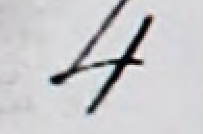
4
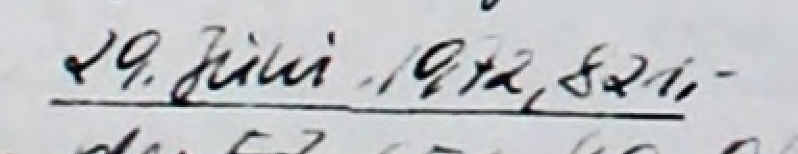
29. Juni 1972, 821, -
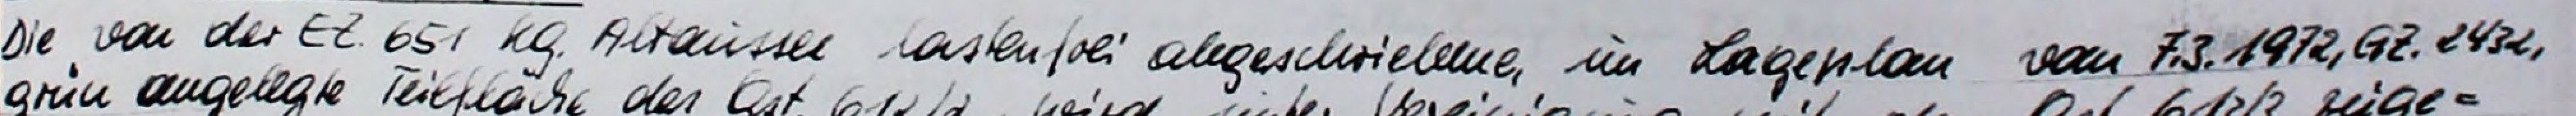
Die von der EZ. 651 Rg. Altaussee lastenfrei abgeschriebene, in Lageplan vom 7.3.1972, 2432,
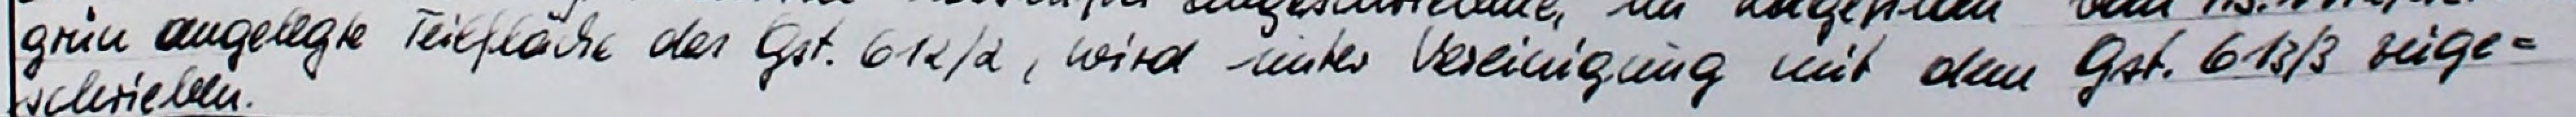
grill angelegte Teilfläche der Gst. 612/2, wird unter Vereinigung mit dem Gst. 613/3 zuge=
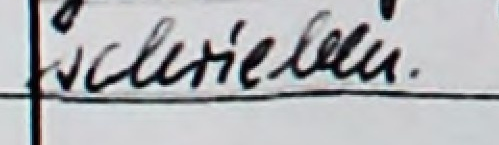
schrieben.
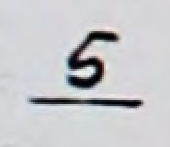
5
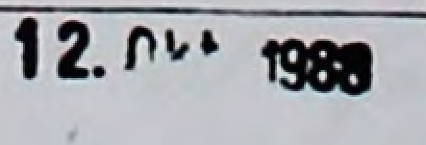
12. Okt 1988
